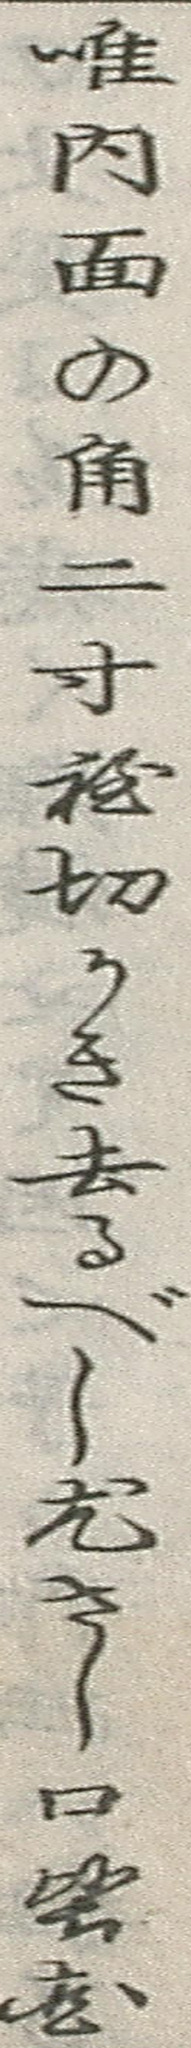唯内面の角二寸程切かき去るべし尤さし口堅固
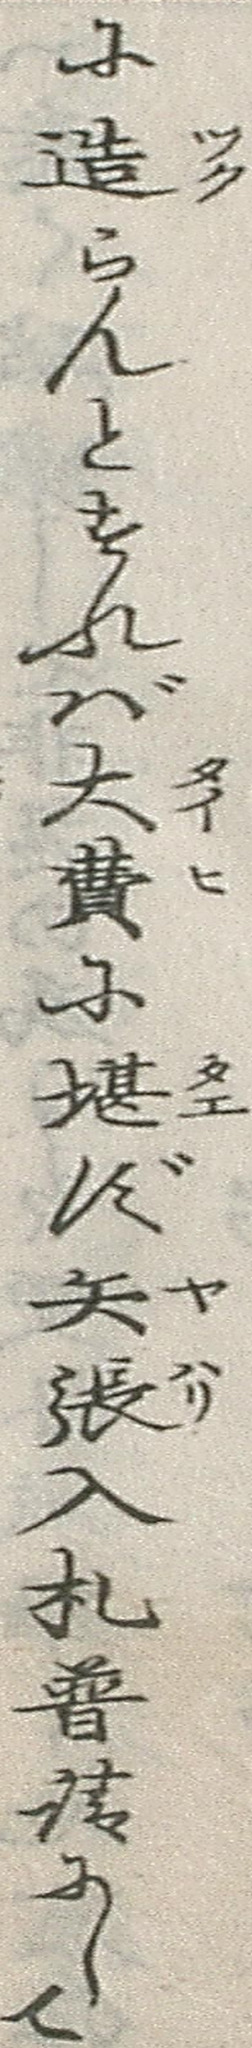に造らんとすれば大費に堪ず矢張入札普請にして
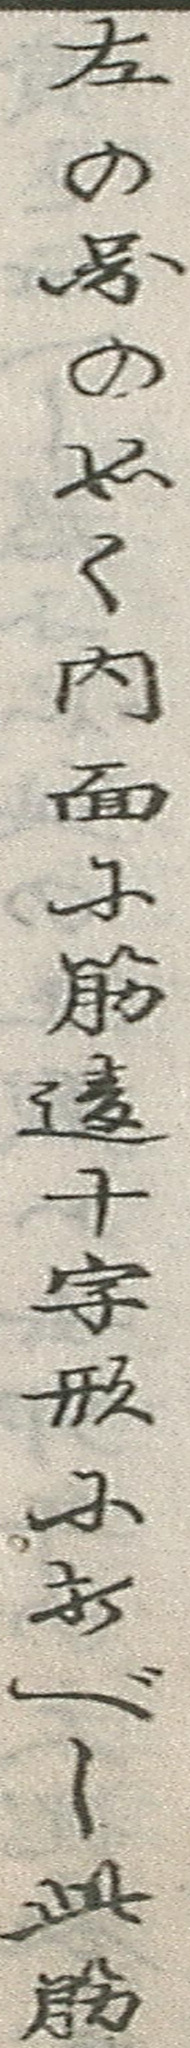左の図の如く内面に筋違十字形に打べし此筋
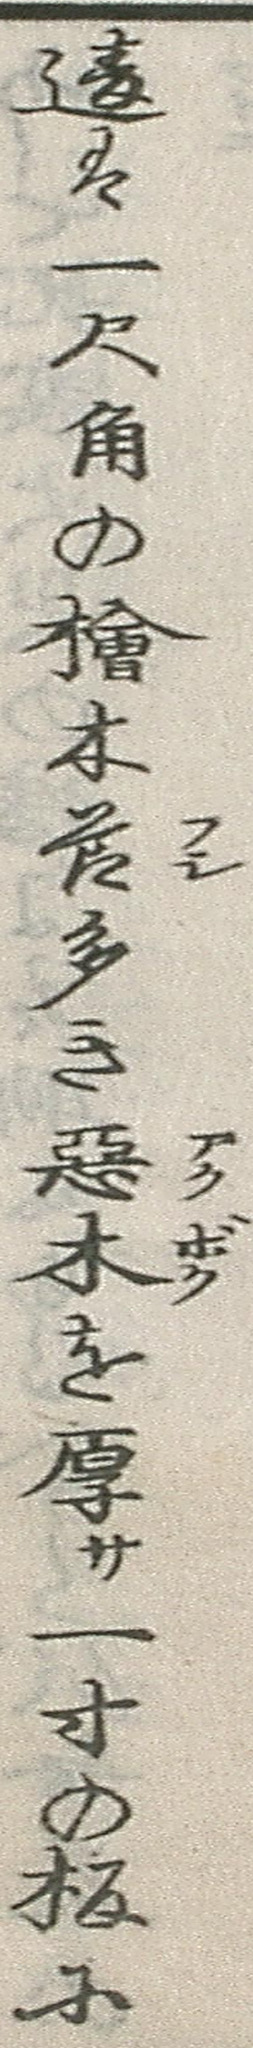違は一尺角の檜木節多き悪木を厚一寸の板に
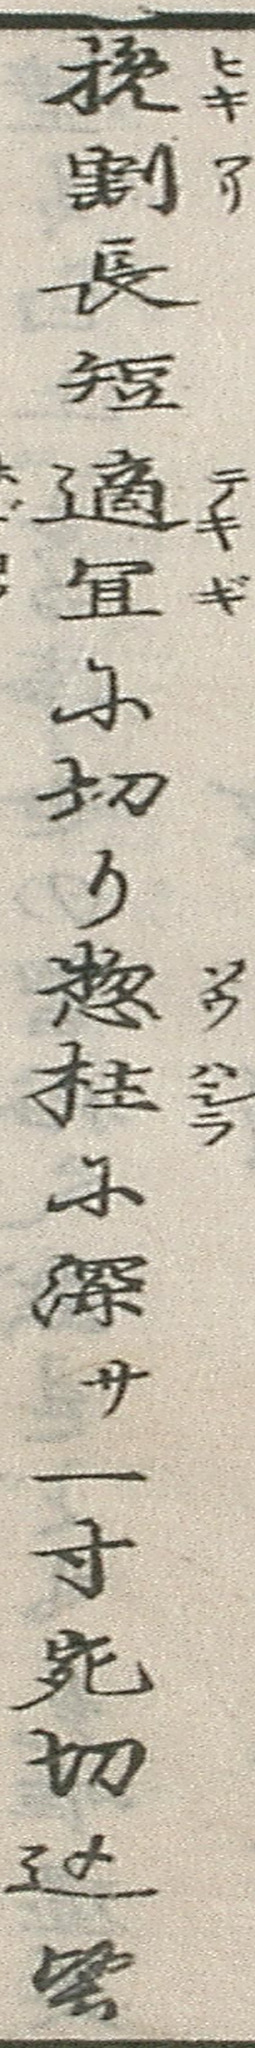挽割長短適宜に切り惣柱に深一寸宛切込堅
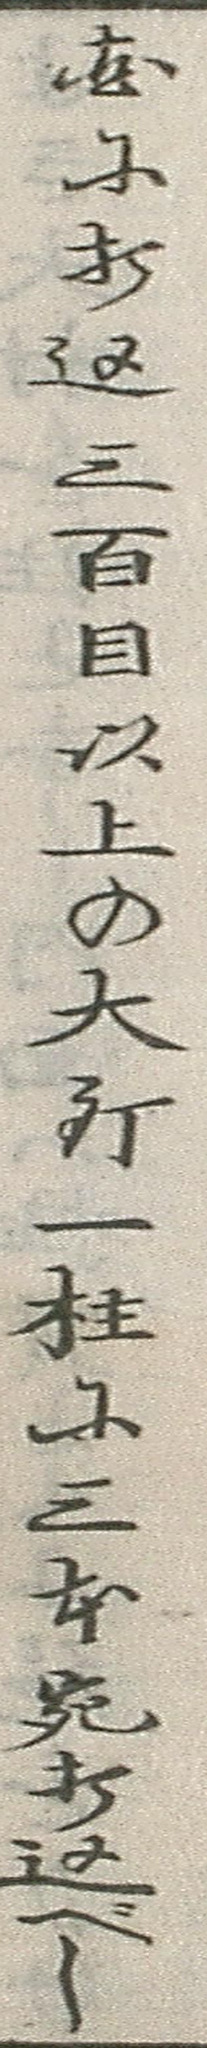固に打込三百目以上の大釘一柱に三本宛打込べし
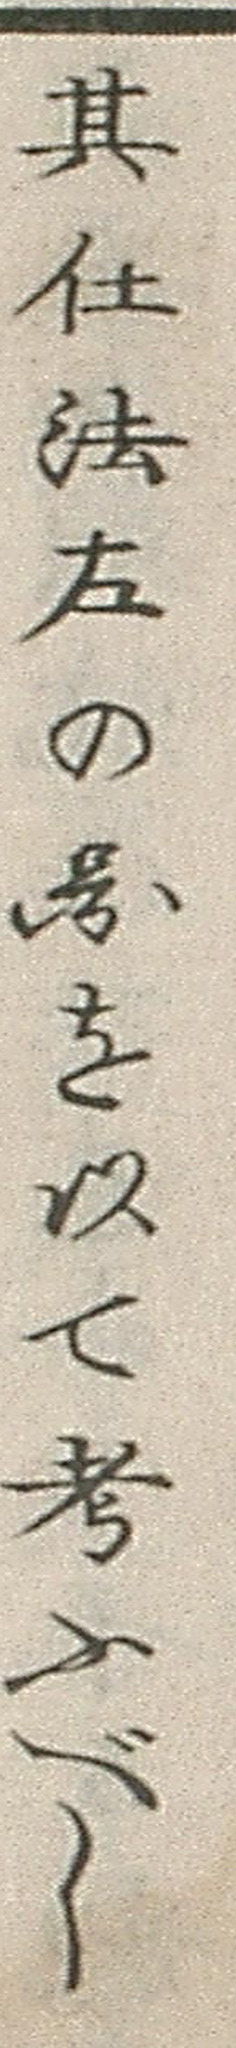其仕法左の図を以て考ふべし

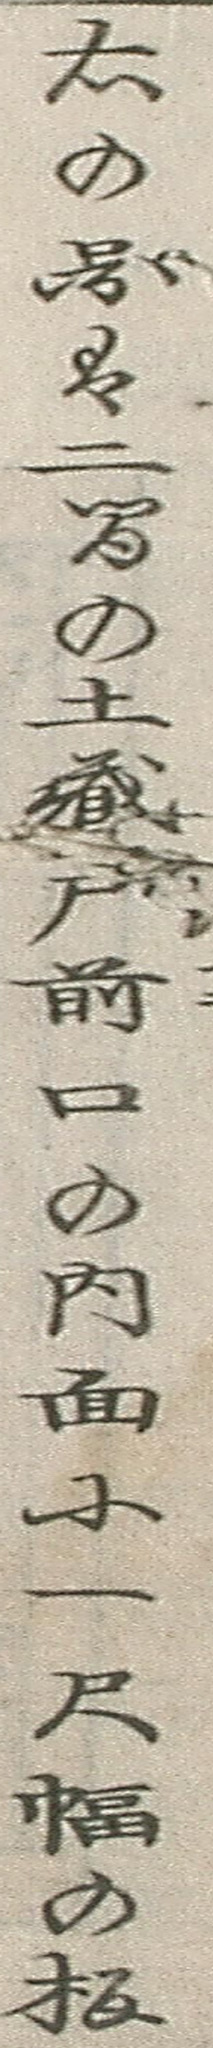右の図は二間の土蔵戸前口の内面に一尺幅の板
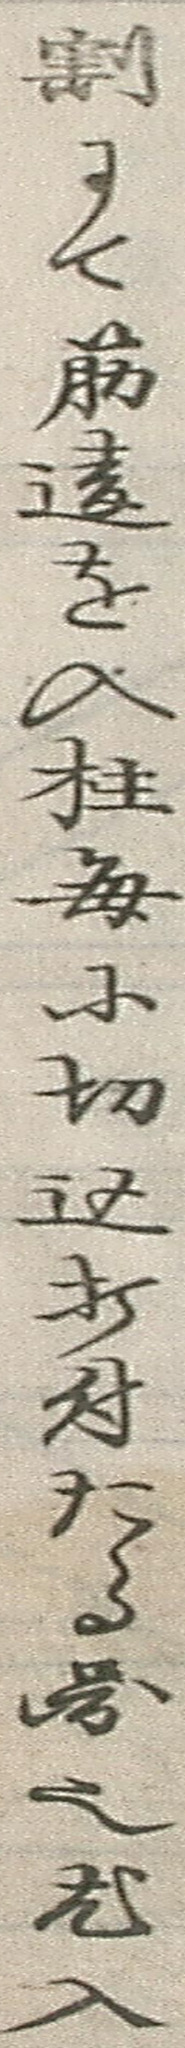割にて筋違を入柱毎に切込打付たる図也尤入
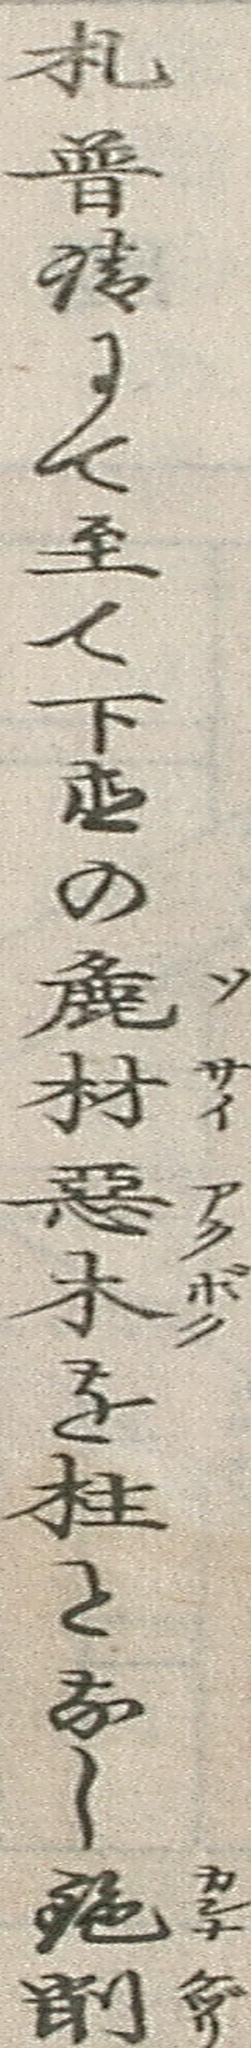札普請にて至て下直の麁材悪木を柱となし鉋削
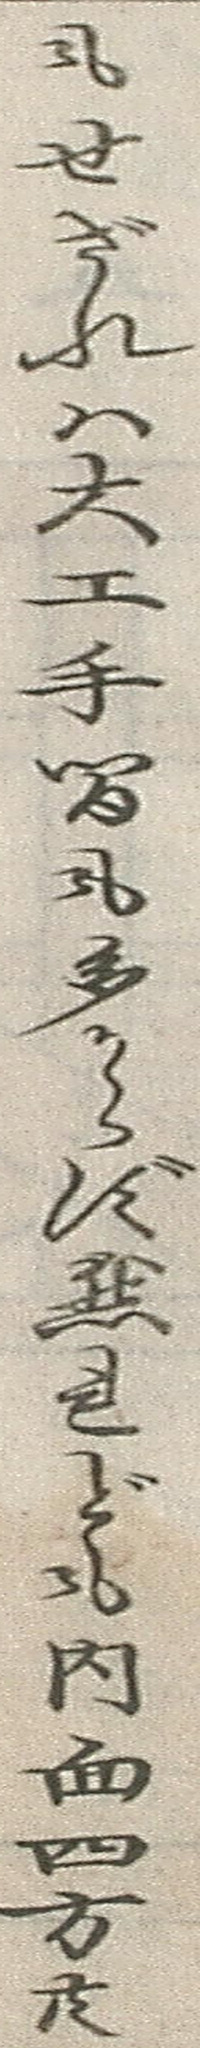もせざれは大工手間も多からず然れども内面四方共
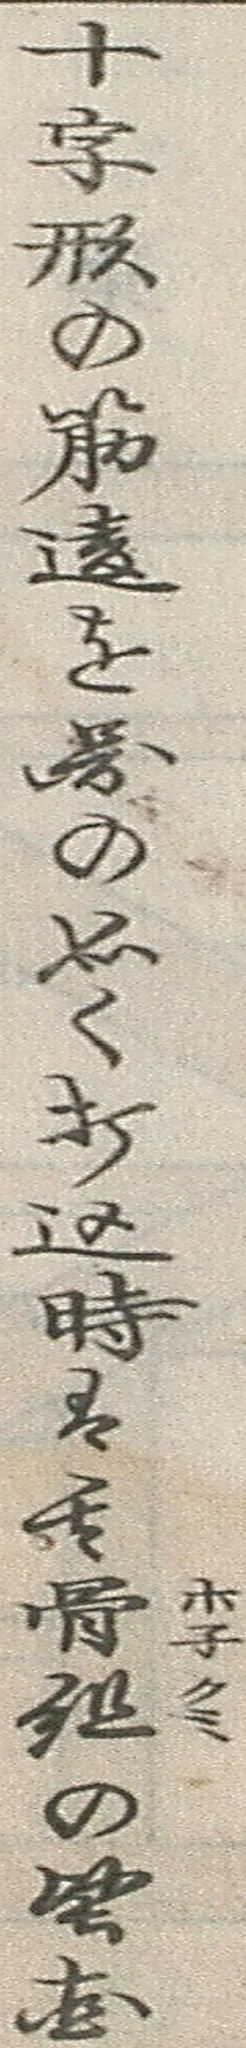十字形の筋違を図の如く打込時は其骨組の堅固
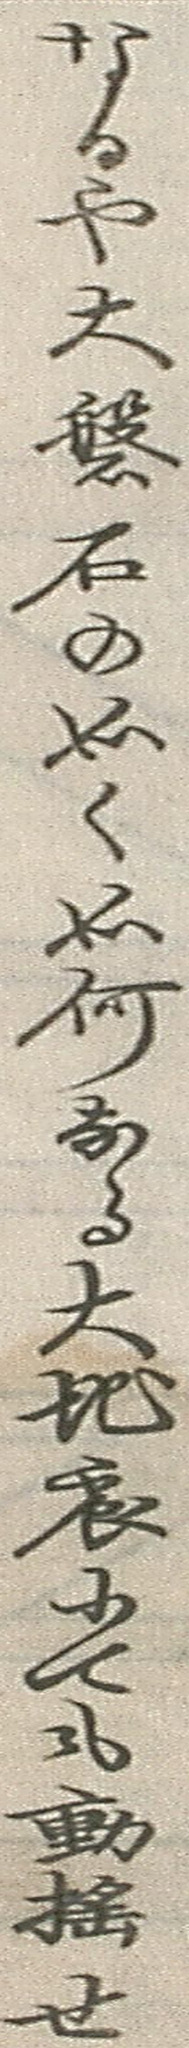なるや大磐石の如く如何なる大地震にても動揺せ
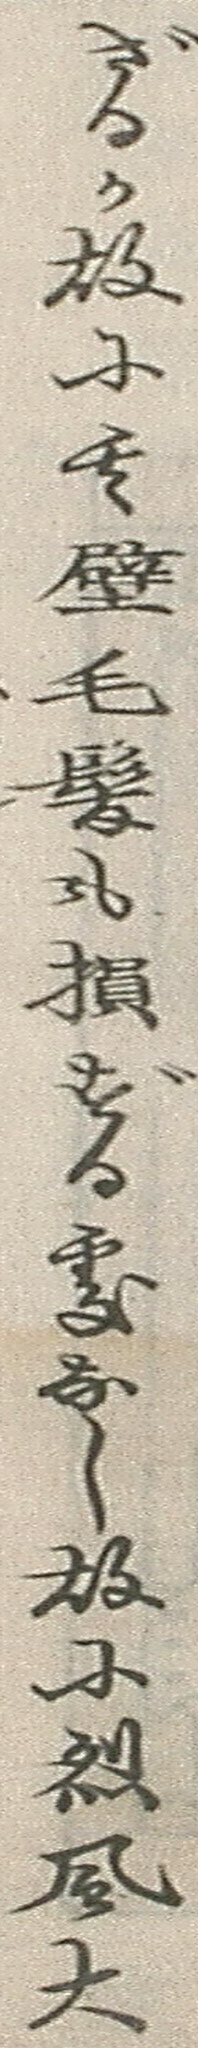ざるか故に其壁毛髪も損ずる処なし故に烈風大
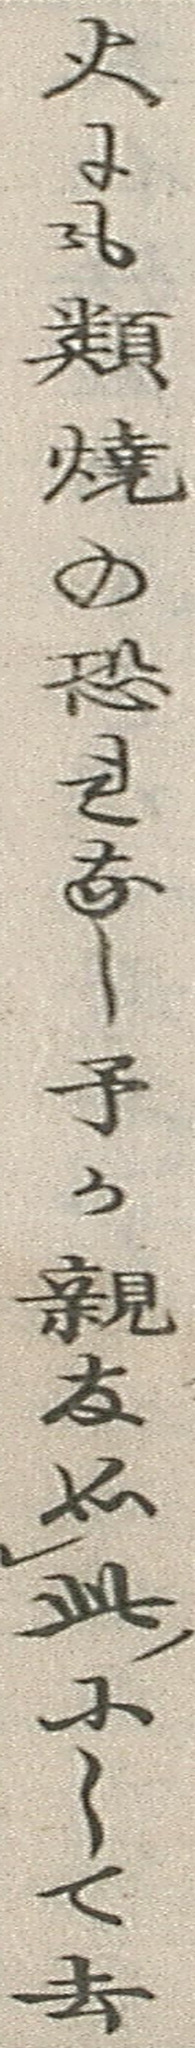火にも類焼の恐れなし予か親友如此去
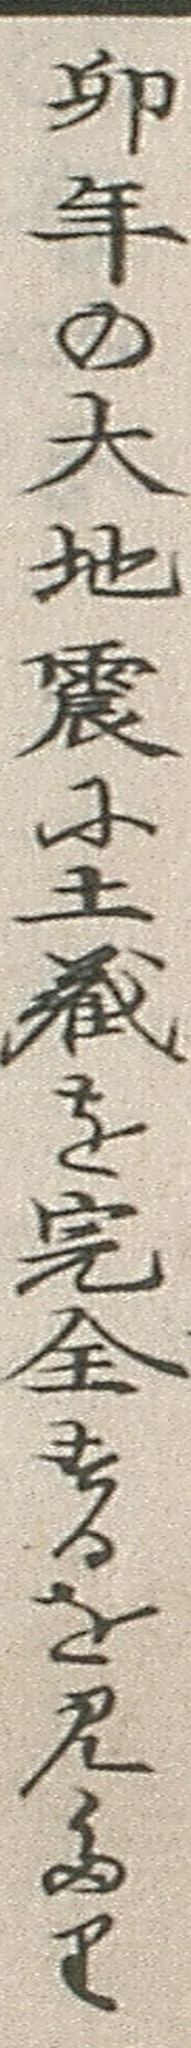卯年の大地震に土蔵を完全するを見たり
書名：附録　地震劇風災害豫防法圖説（内題）
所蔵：東京大学地震研究所図書室 Earthquake Research Institute Library, The University of Tokyo, JAPAN
